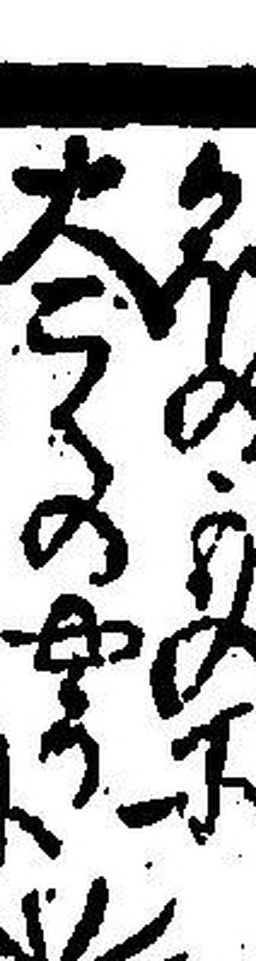大こくのやうに
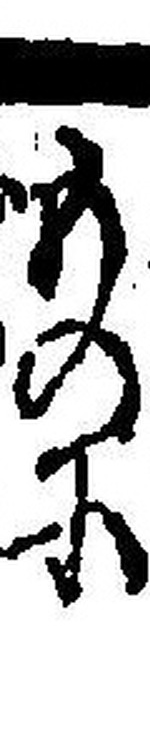ものに
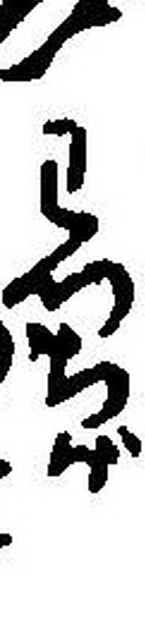わつちが
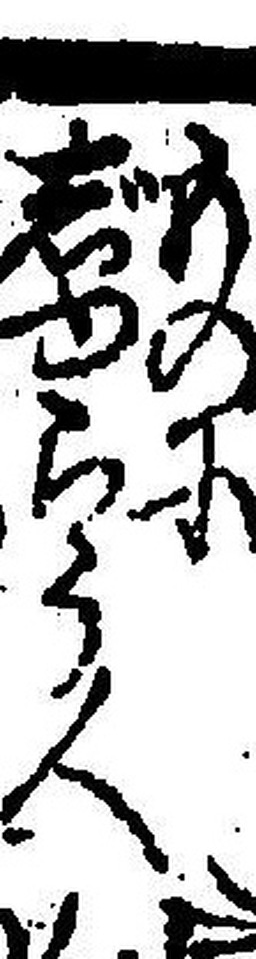じゆらう人
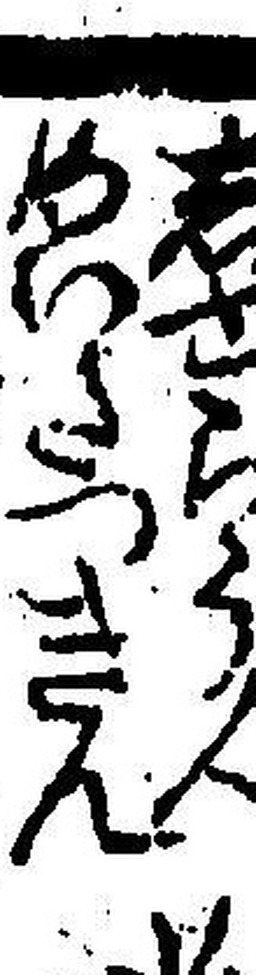めいたつきん
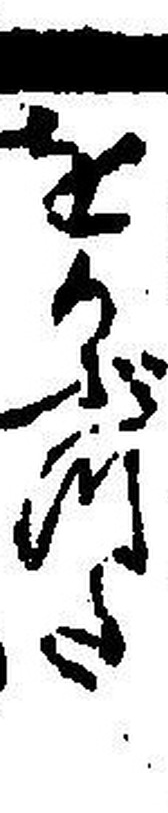をかぶつた
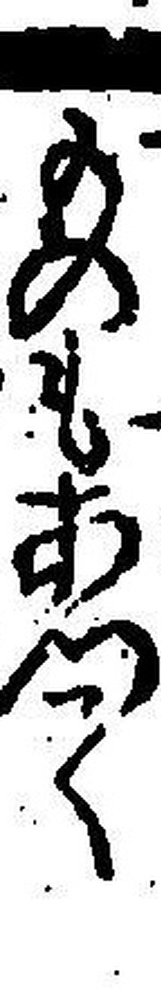ものあつて
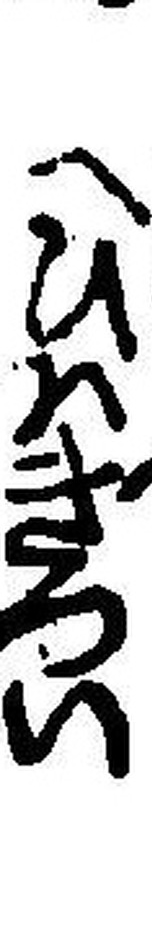へひはきつい
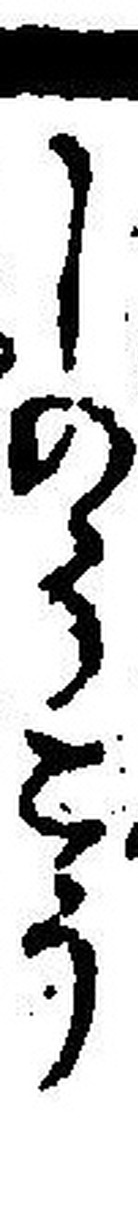しのうこう
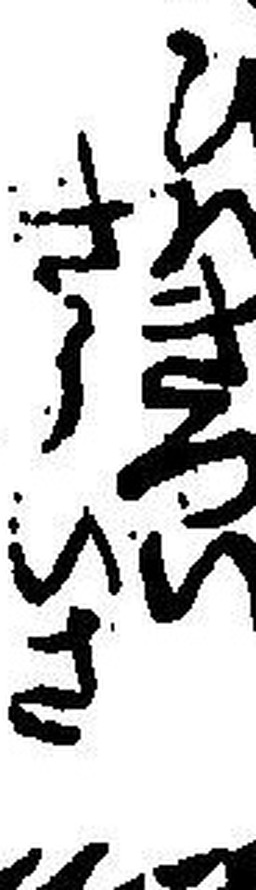きらいさ
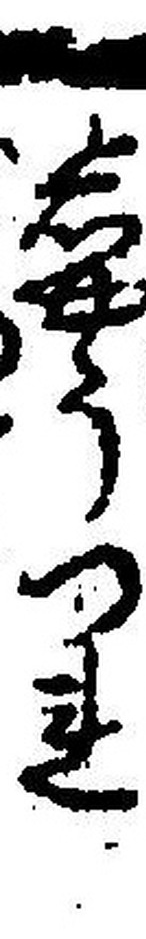しやうつれ
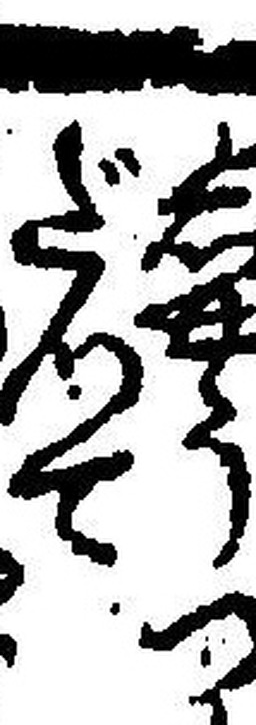だつて
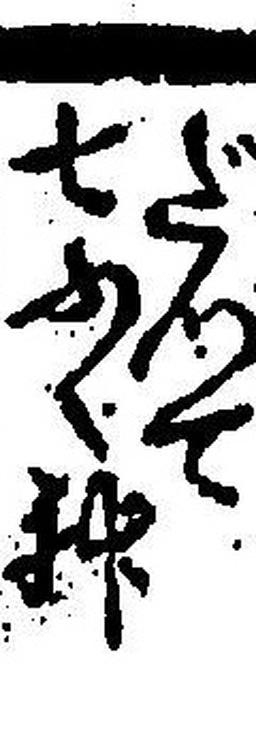七ふく神
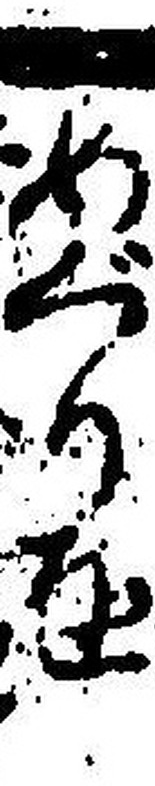めぐりを
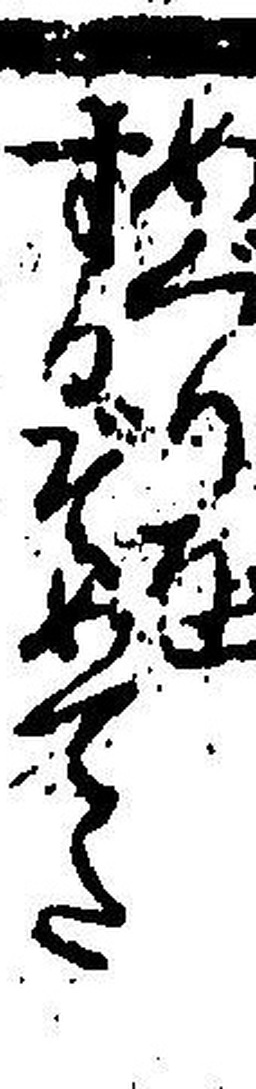するぞめてた
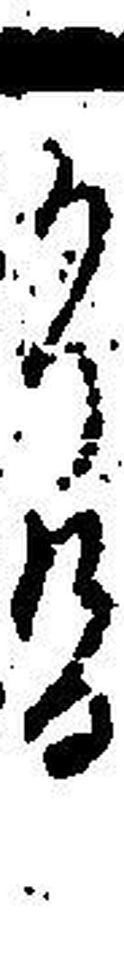かりける
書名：徳若水縁起金性 / 樹下石上作
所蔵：東京大学総合図書館 General Library in the University of Tokyo, JAPAN
